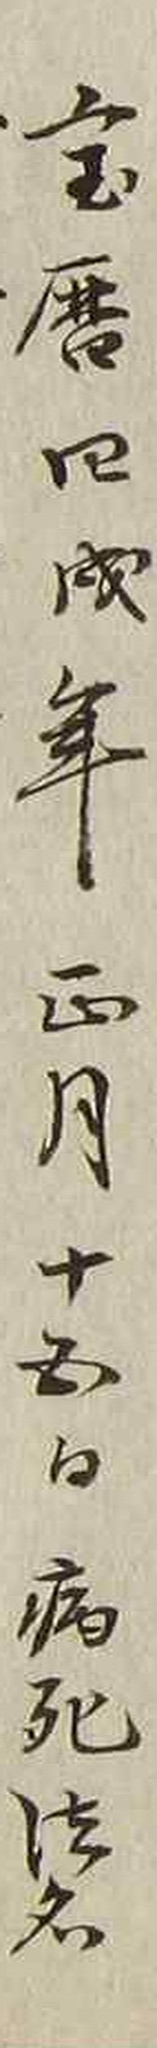宝暦四戌年正月十五日病死法名
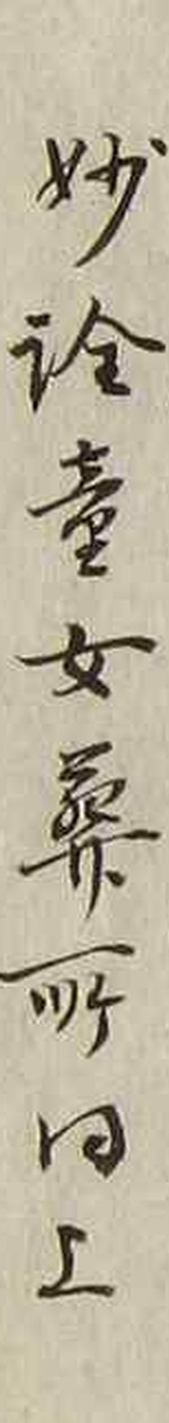妙詮童女葬所同上

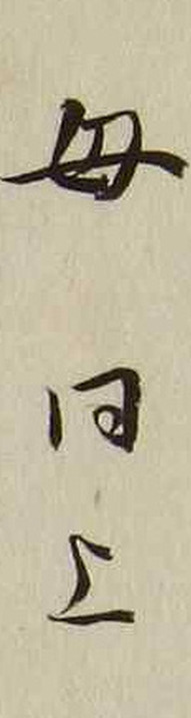母同上
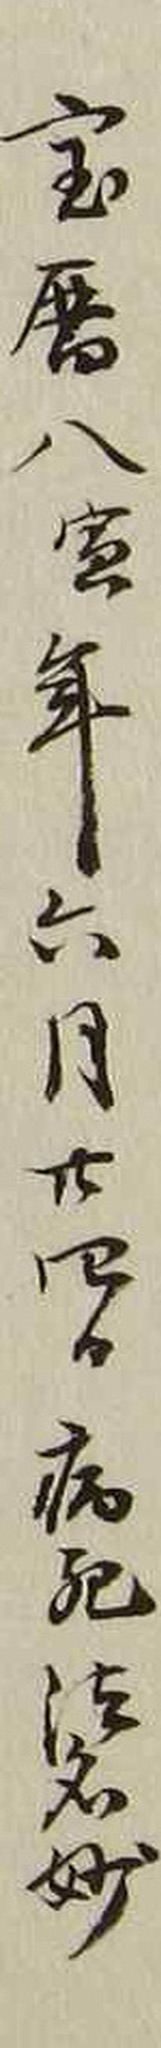宝暦八寅年六月廿四日病死法名妙
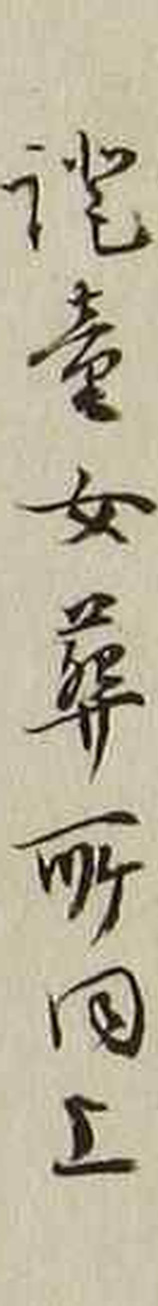證童女葬所同上
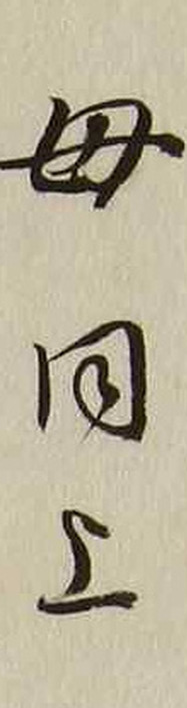母同上
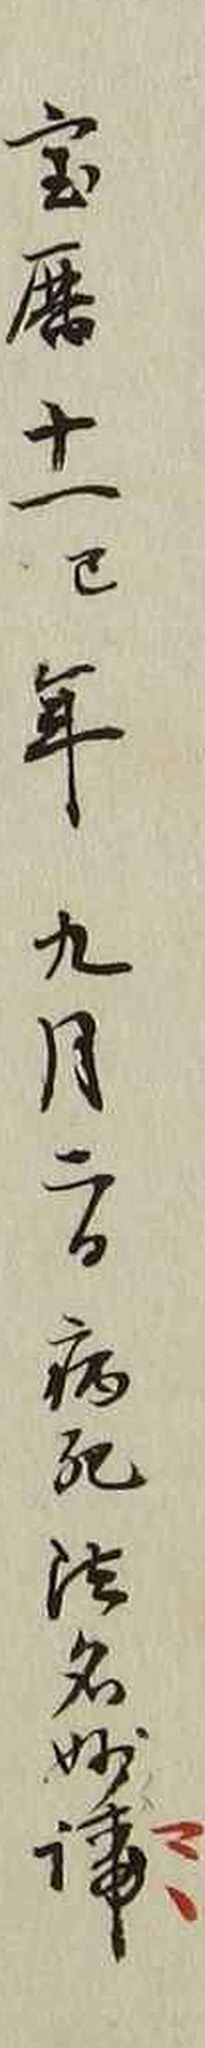宝暦十一巳年九月二日病死法名妙謹
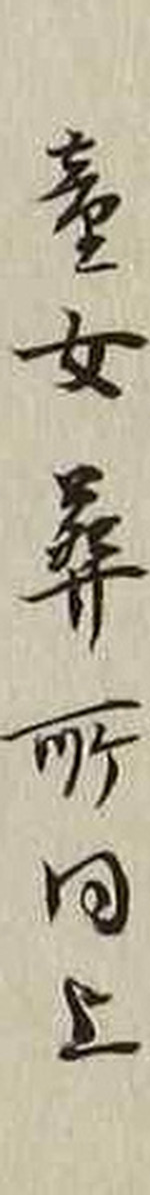童女葬所同上
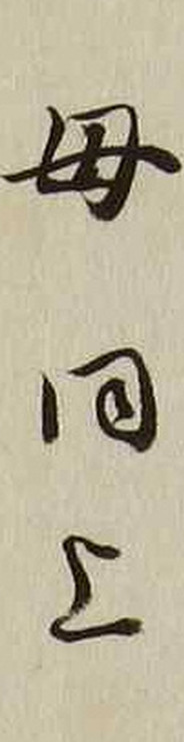母同上
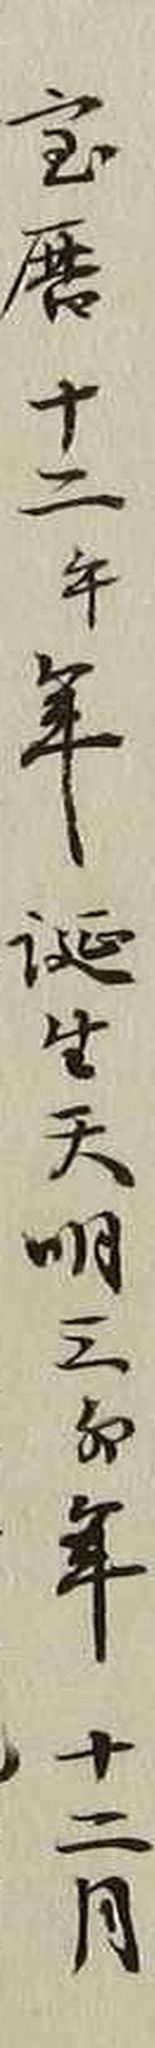宝暦十二午年誕生天明卯年十二月
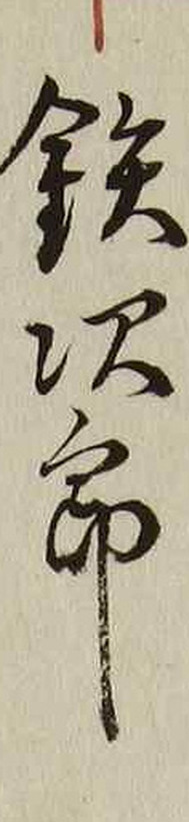鉄次郎
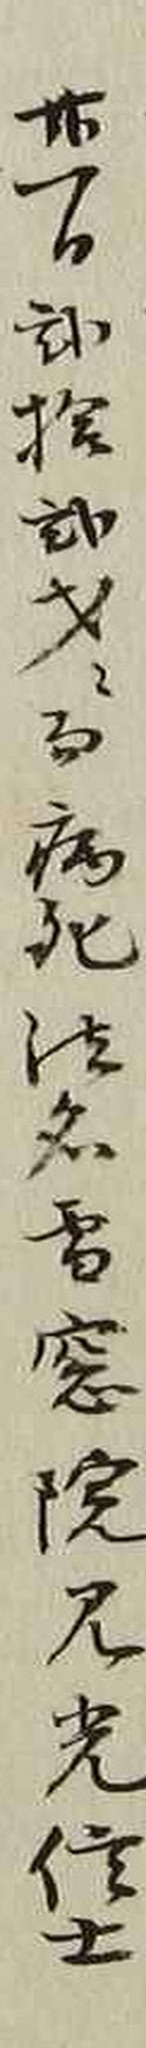卅一日弐拾弐歳ニて病死法名雪窓院見光信士
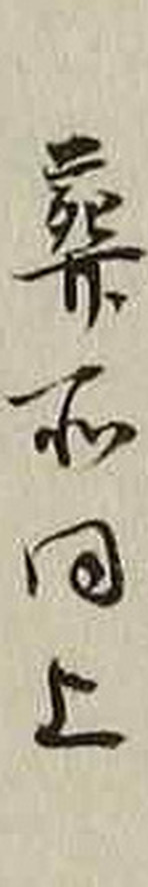葬所同上
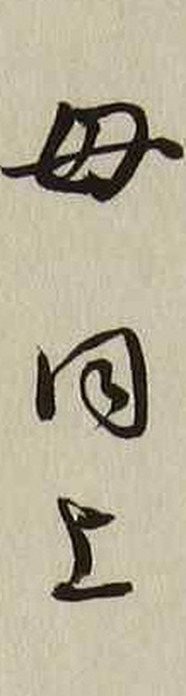母同上
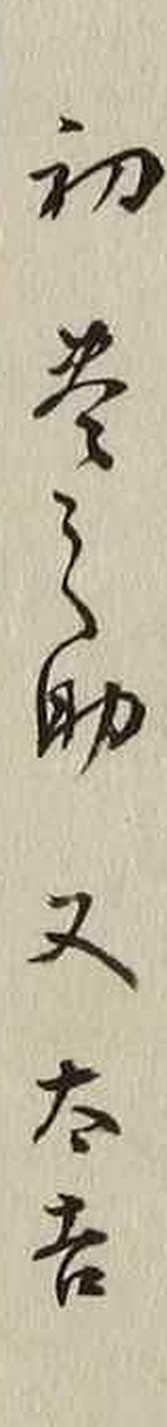初巻之助又太吉
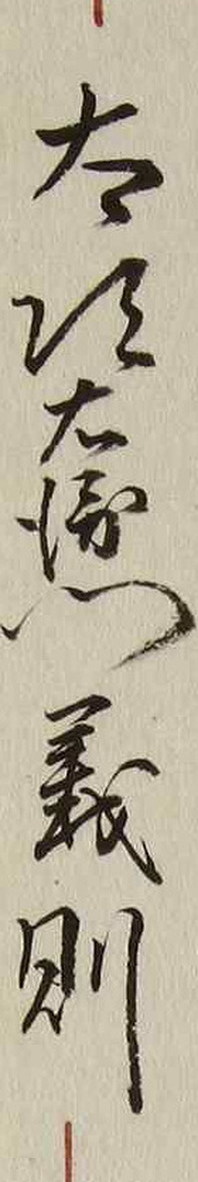太治右衛門義則
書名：諸士系譜　巻之16　い之部16
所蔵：会津若松市立会津図書館
